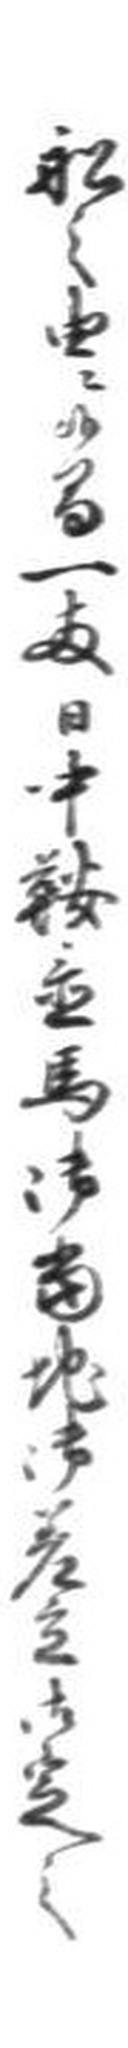船之由ニ候間一両日中鞍置馬御当地御差立御定之
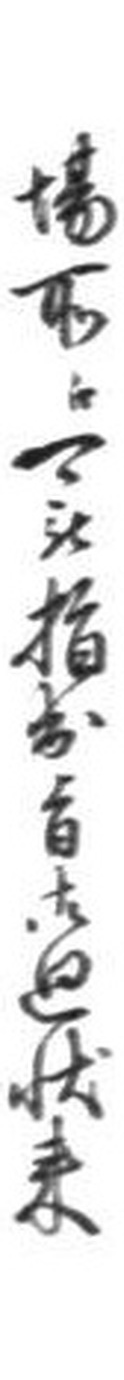場所江可被指出旨御廻状来

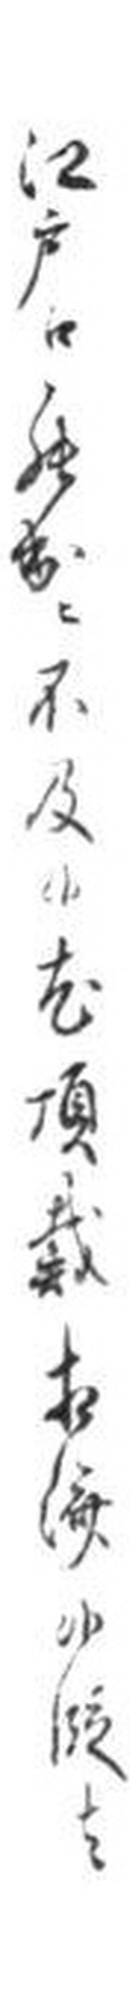江戸江罷出ニ不及候尤頂戴相済候段者
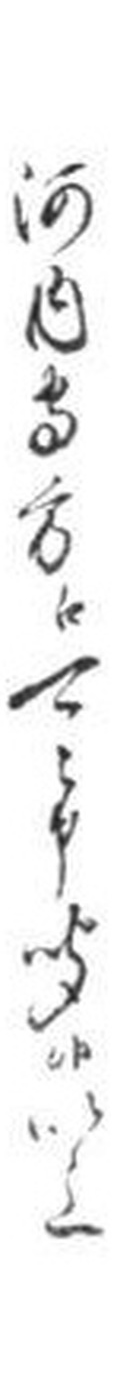河内守方江可被申聞候以上
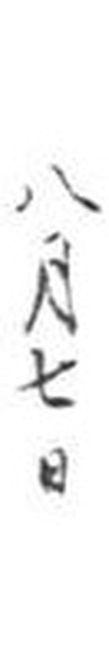八月七日
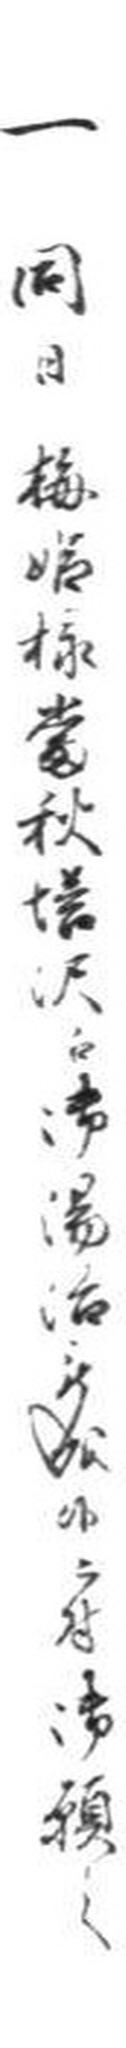一同日梅姫様当秋塔沢江御湯治被成候ニ付御願之
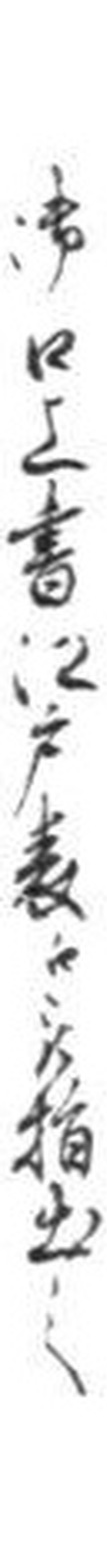御口上書江戸表江被指出之
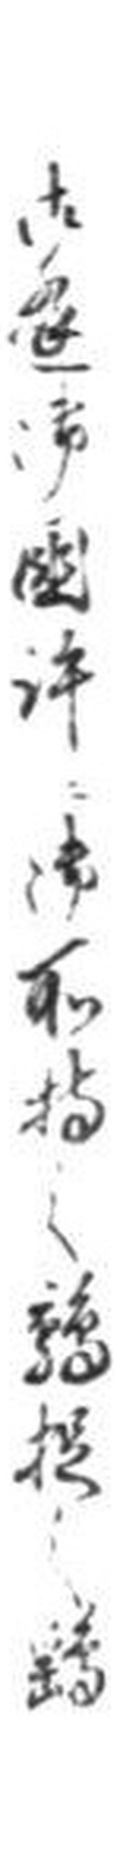御逢御国許ニ御所持之鶉捉之鷂
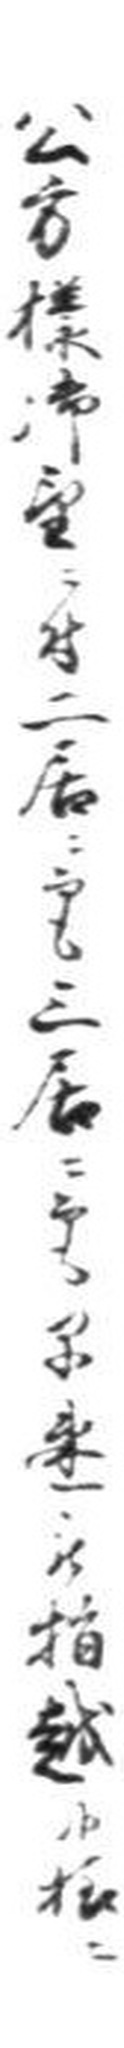公方様御望ニ付二居ニ而も三居ニ而も早速被指越候様ニ
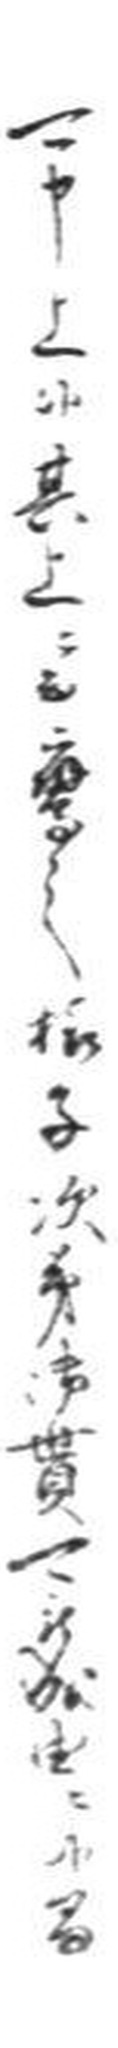可申上候其上ニ而鷹之様子次第御貰可被成由ニ候間
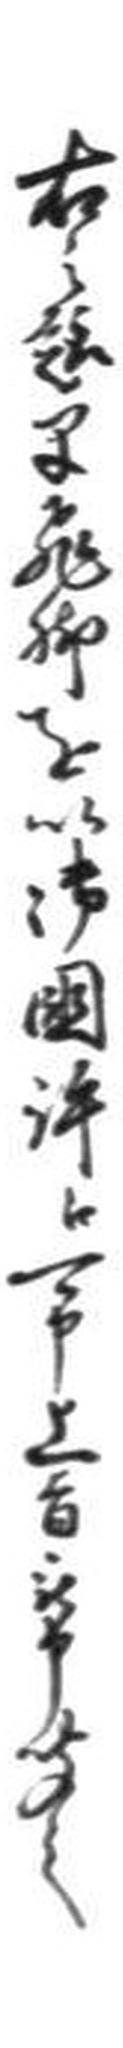右之趣早飛脚を以御国許江可申上旨被申聞之
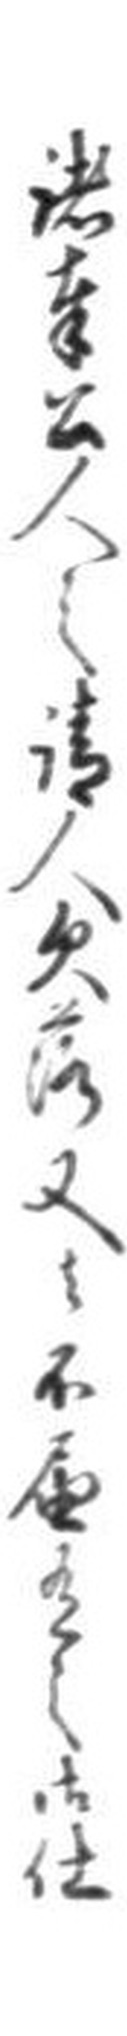諸奉公人之請人欠落又者不届有之御仕
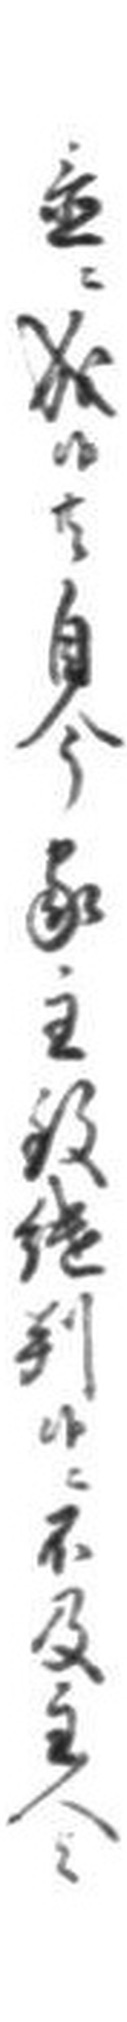置ニ成候共自今家主致継判候ニ不及主人与
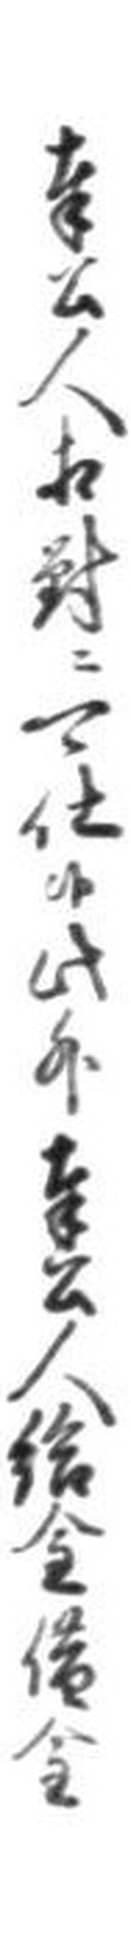奉公人相対ニ可仕候此外奉公人給金借金
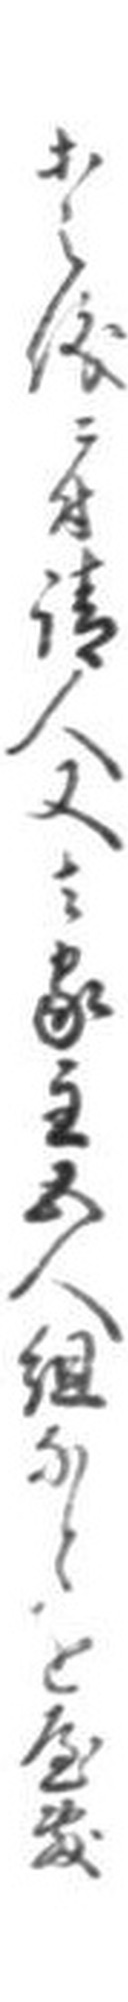等之儀ニ付請人又者家主五人組なとを屋敷
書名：家譜 三十三 吉邦公 享保四年
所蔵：福井県文書館 Fukui Prefectural Archives
